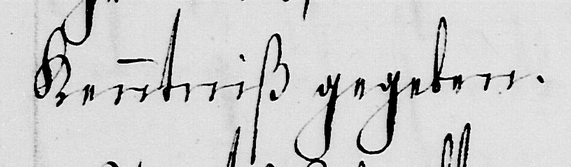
Kenntniß gegeben.
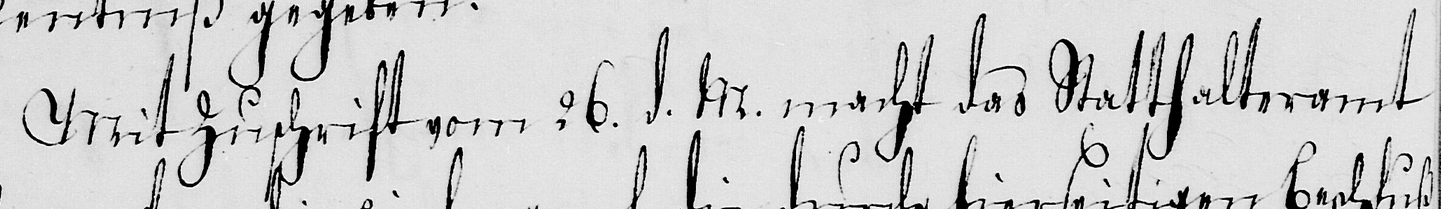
Mit Zuschrift vom 26. d. M. macht das Statthalteramt
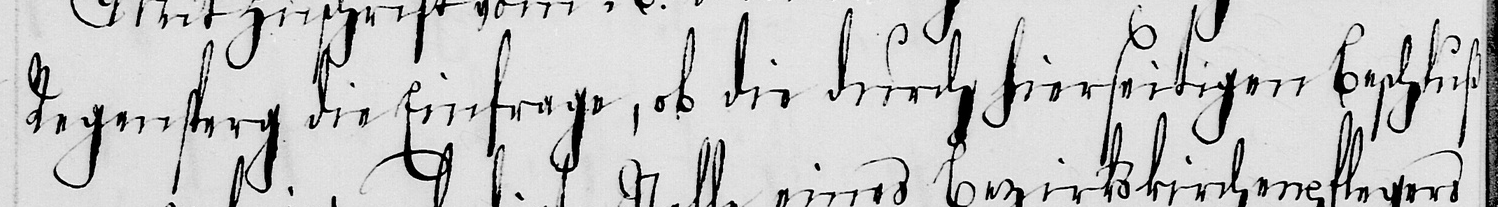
Regensberg die Einfrage, ob die durch hierseitigen Beschluß
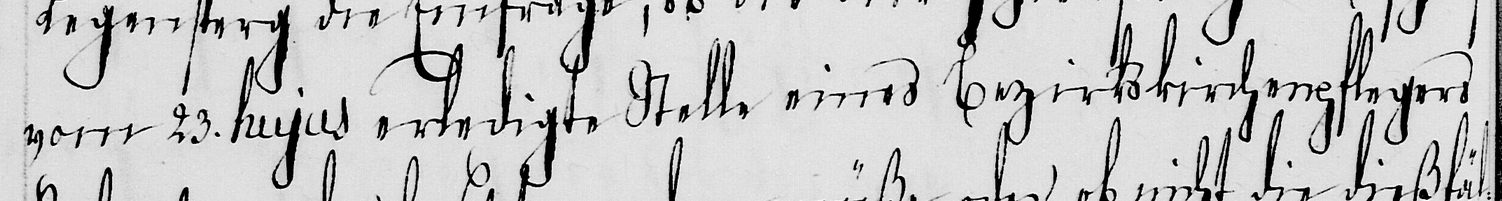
vom 23. hujus erledigte Stelle eines Bezirkskirchenpflegers
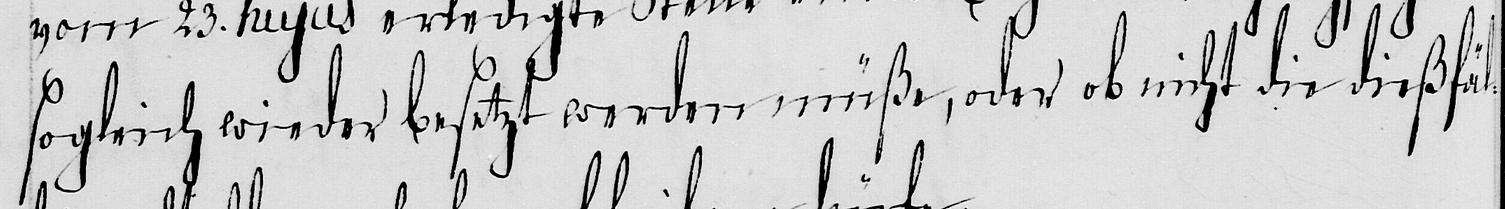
sogleich wieder besetzt werden müße, oder ob nicht die dießfäl¬
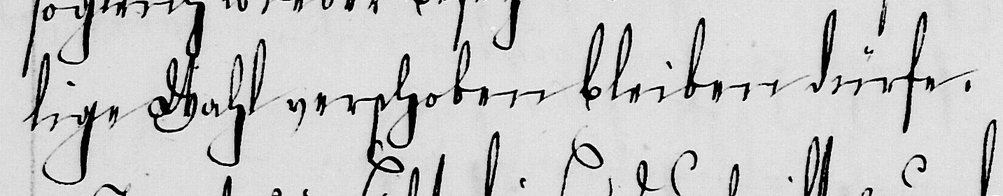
lige Wahl verschoben bleiben dürfe.
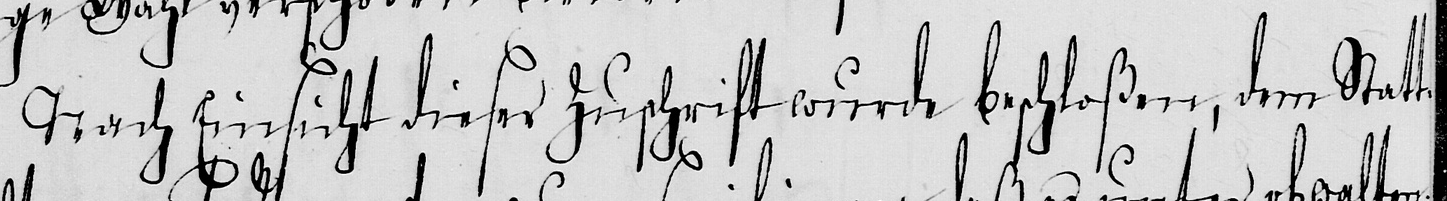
Nach Einsicht dieser Zuschrift wurde beschloßen, dem Stat¬
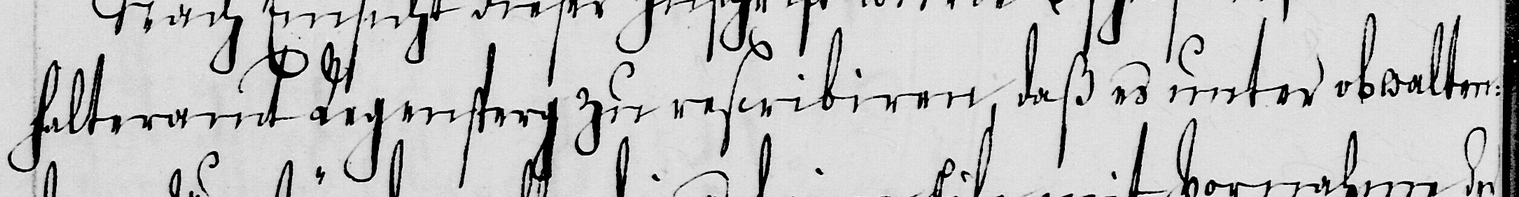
thalteramt Regensberg zu rescribiren, daß es unter obwalte¬
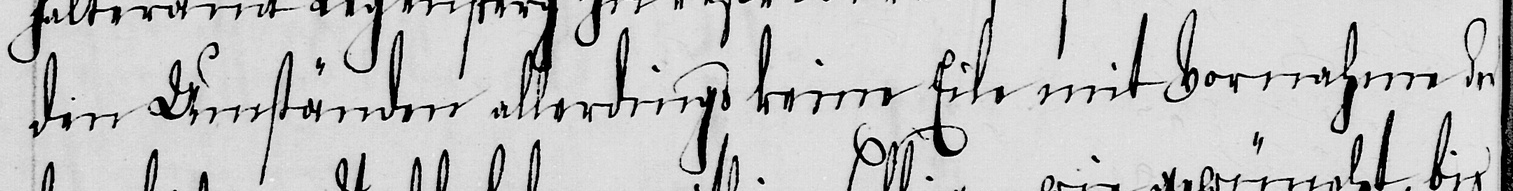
nden Umständen allerdings keine Eile mit Vornahme der
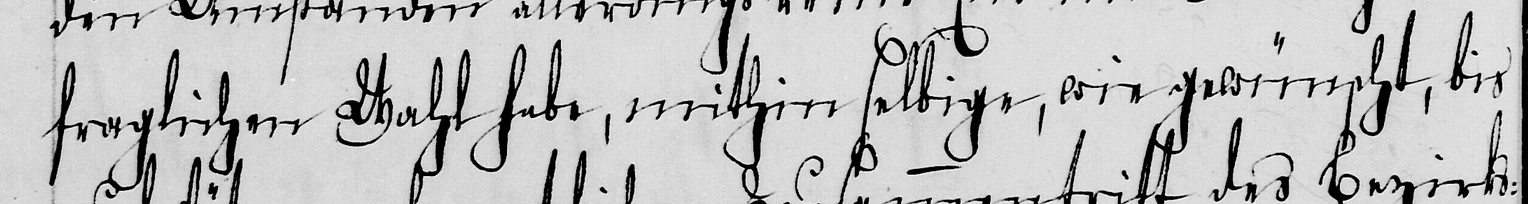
fraglichen Wahl habe, mithin selbige, wie gewünscht, bis
